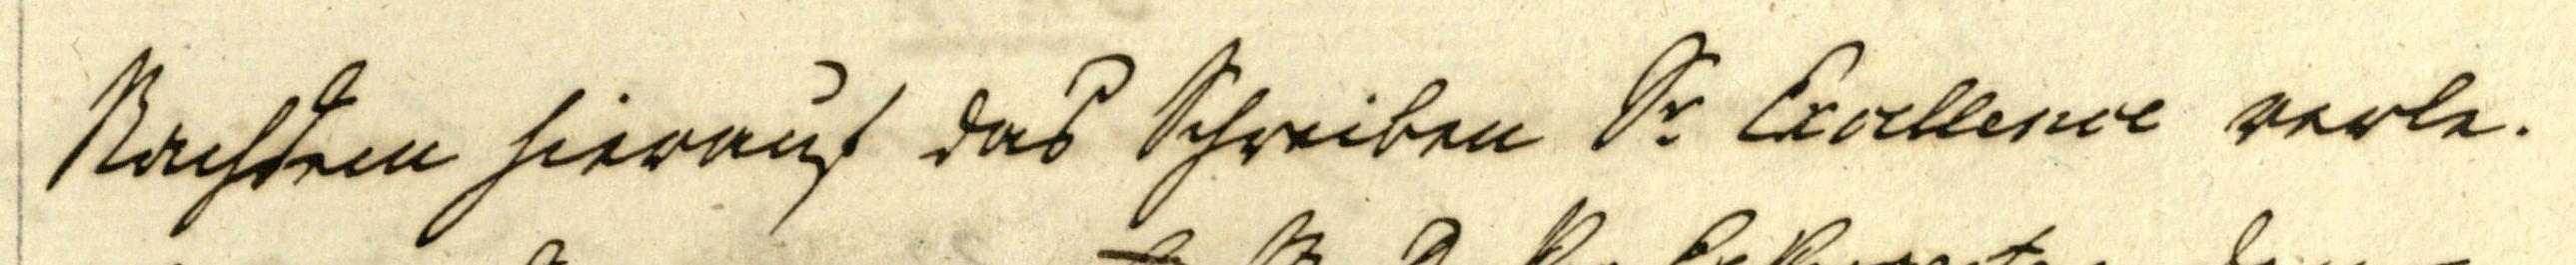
Nachdem hierauf das Schreiben Sr Excellence verle¬
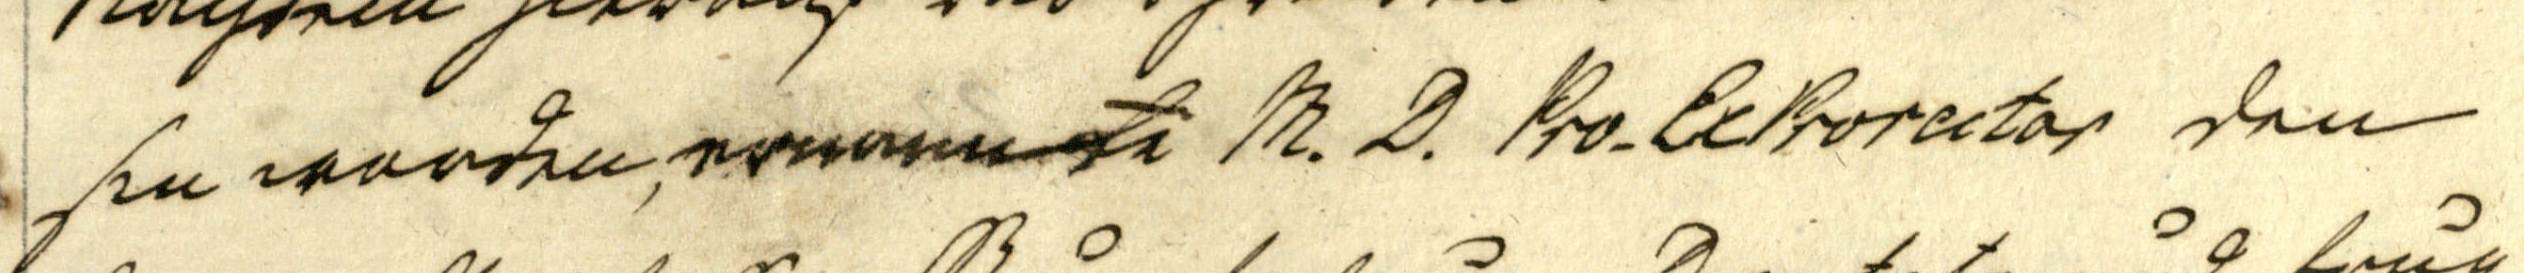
sen worden, ernannte M. D. Pro. ExProrector den
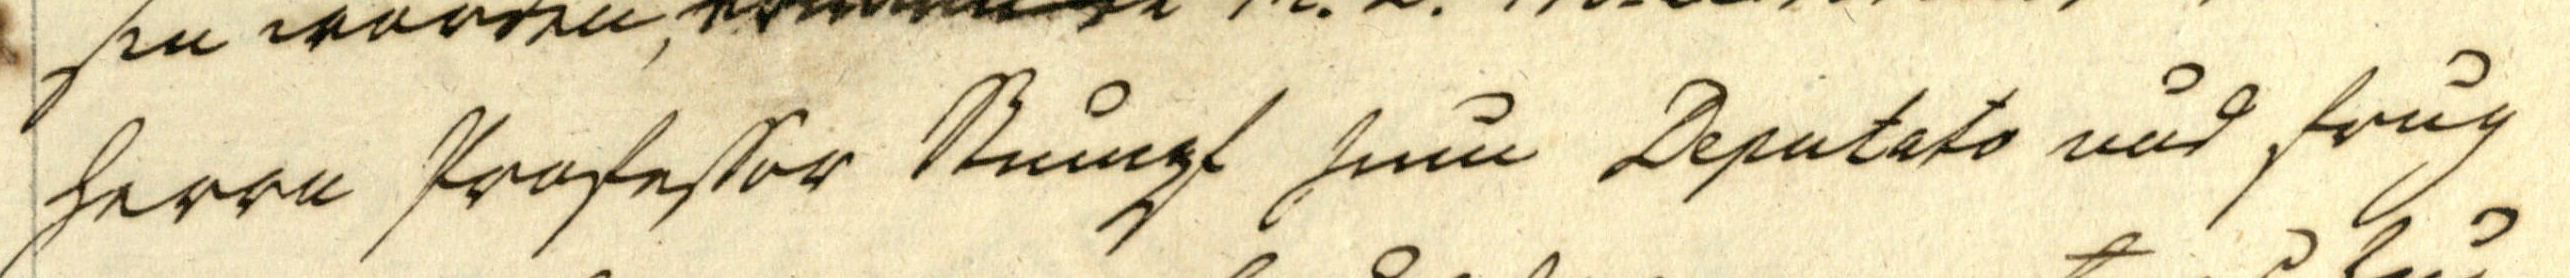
Herrn Professor Stumpf zum Deputato und frug
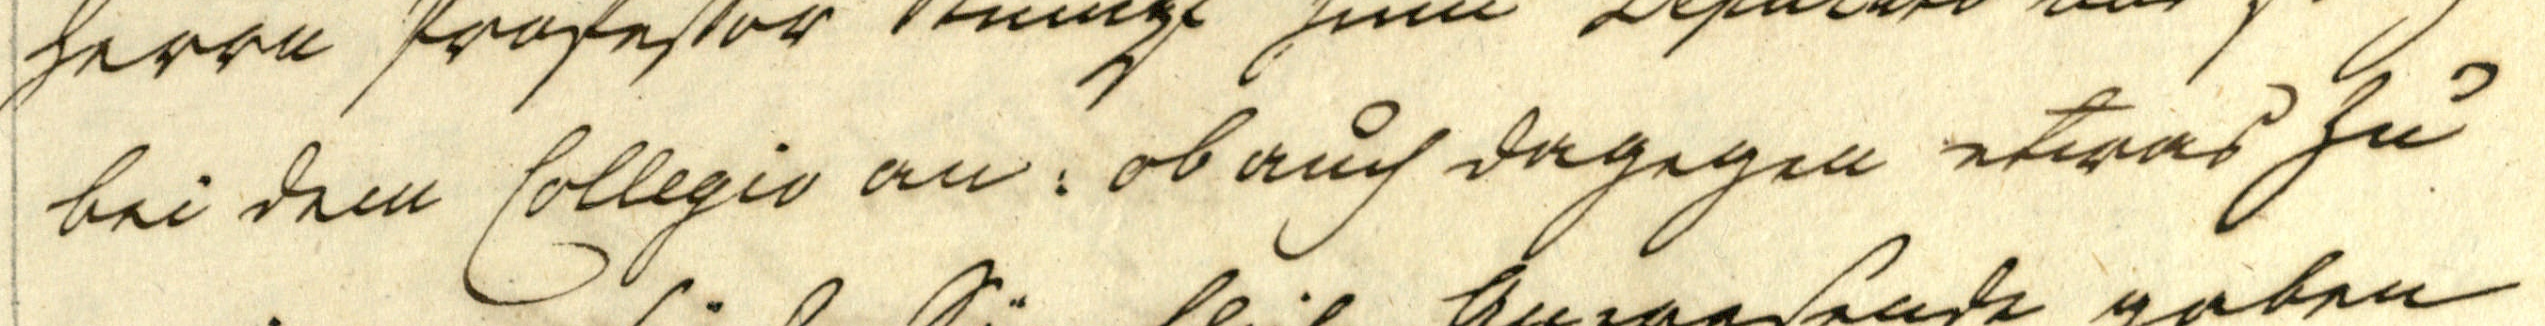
bei dem Collegio an: ob auch dagegen etwas zu
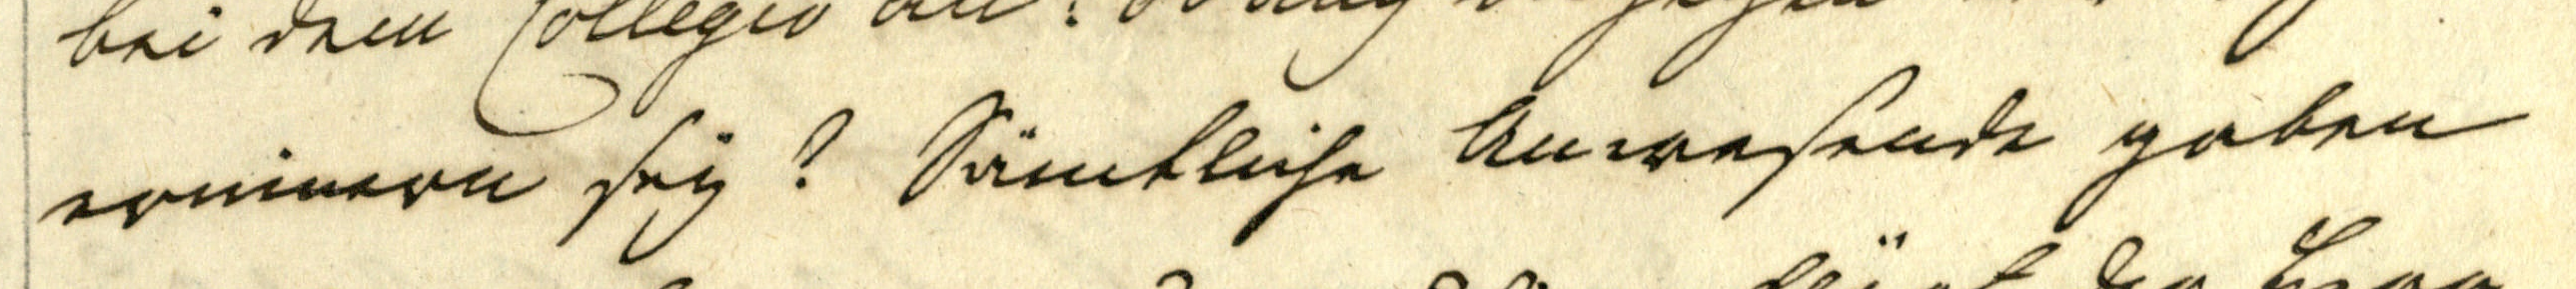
erinnern seÿ ? Sämtliche Anwesende gaben
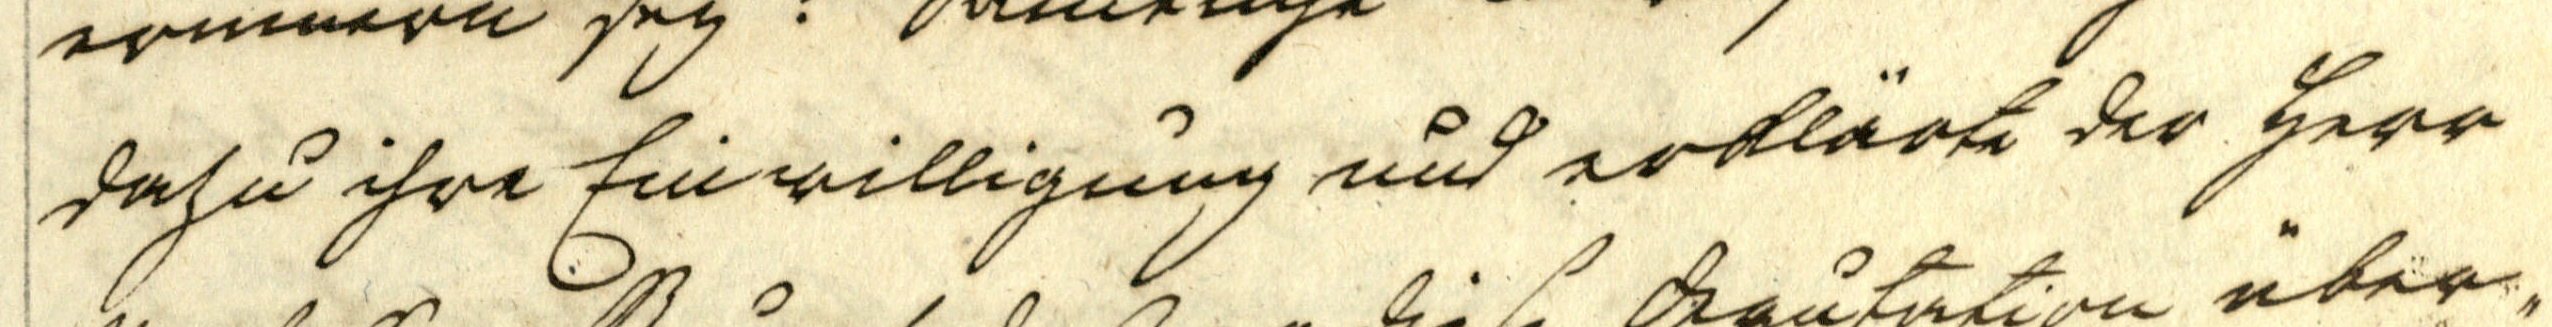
dazu ihre Einwilligung und erklärte der Herr
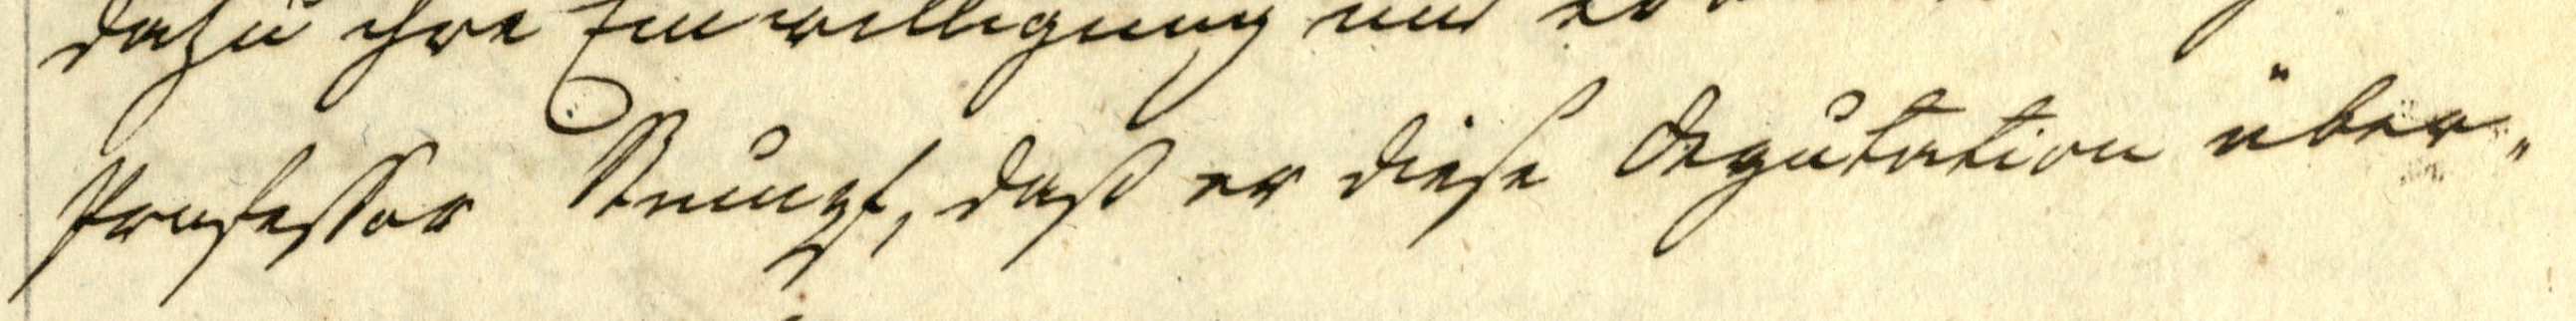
Professor Stumpf, daß er diese Deputation über¬
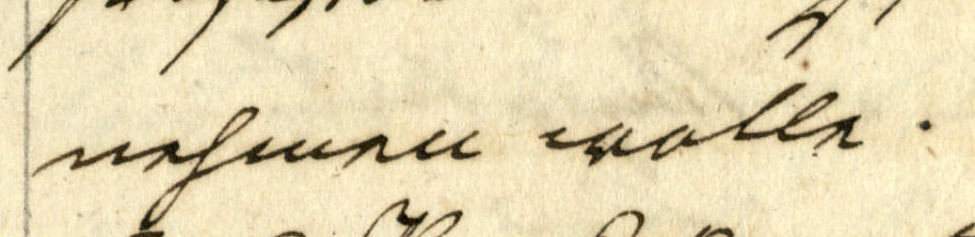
nehmen wolle.
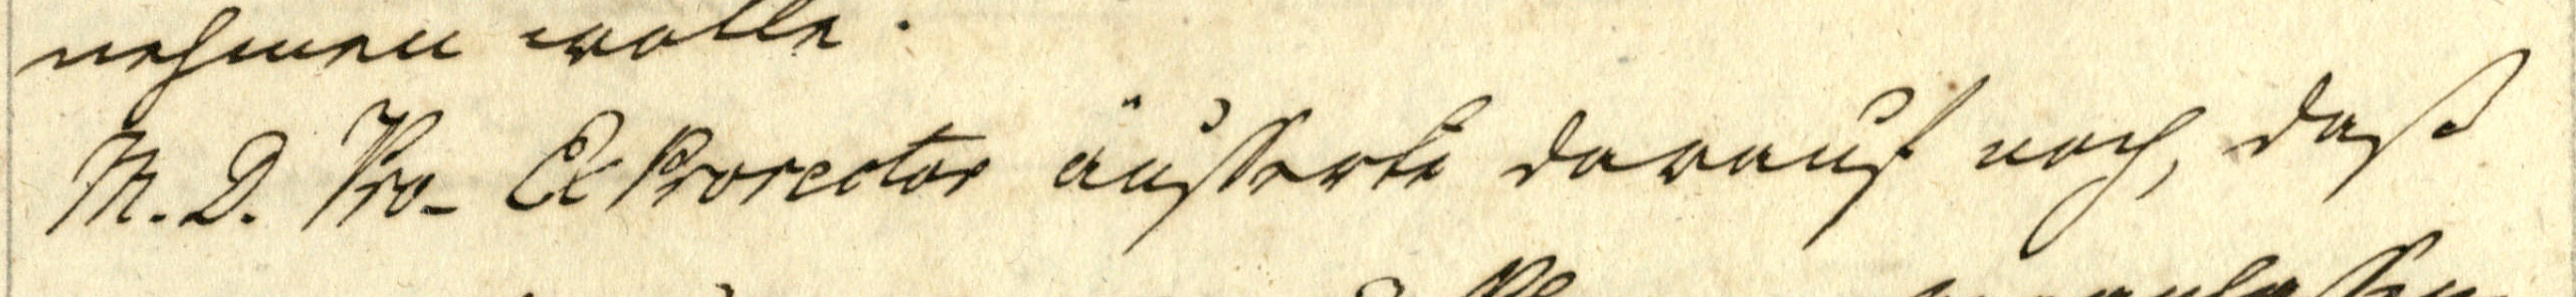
M. D. Pro. ExProrector äusserte darauf noch, daß
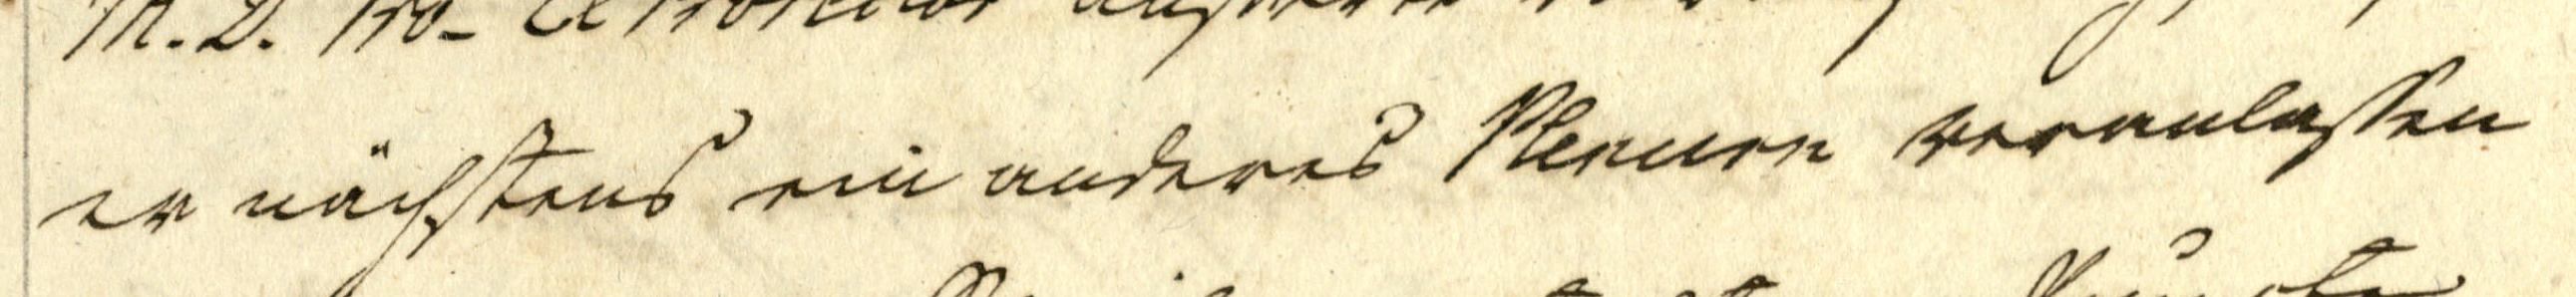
er nächstens ein anderes Plenum veranlassen
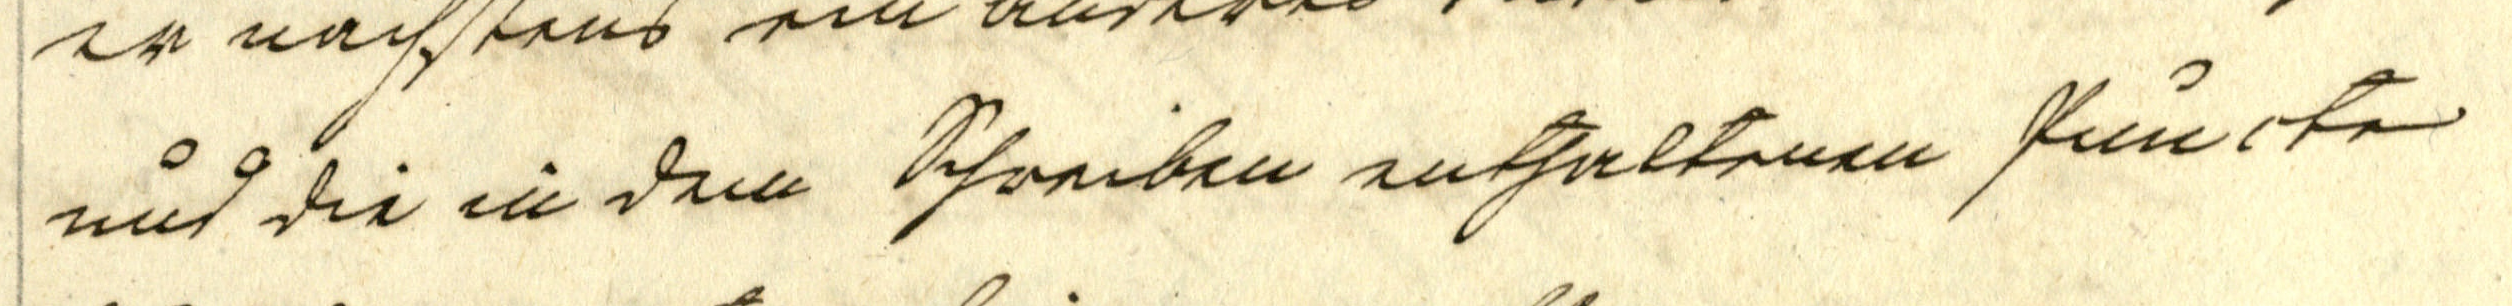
und die in dem Schreiben enthaltenen Puncte
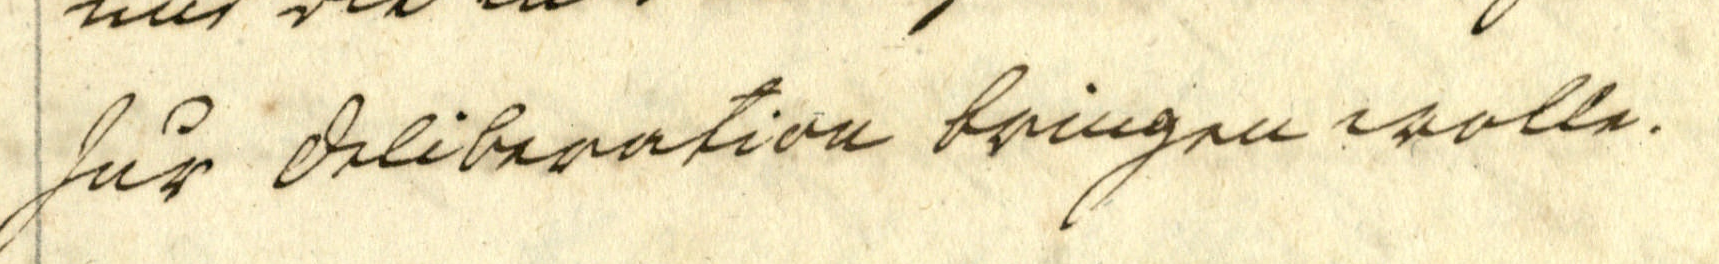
zur Deliberation bringen wolle.
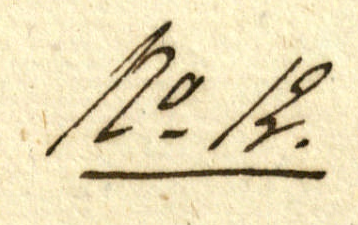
No 12.
